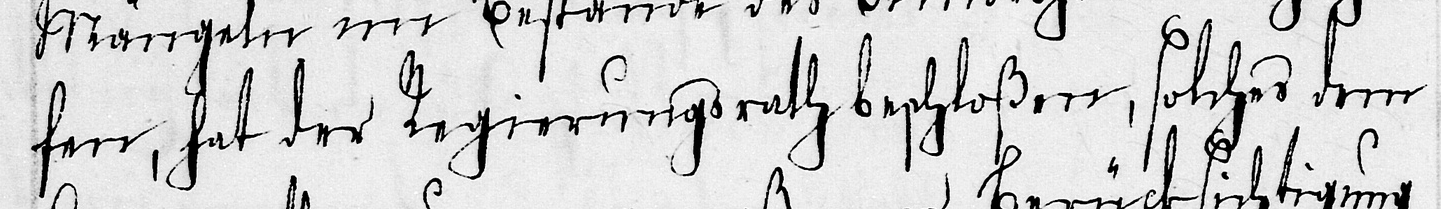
fen, hat der Regierungsrath beschloßen, solches dem
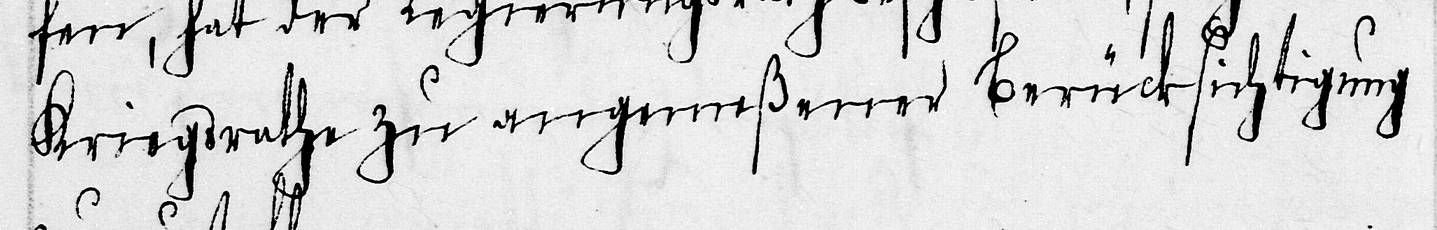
Kriegsrathe zu angemeßener Berücksichtigung
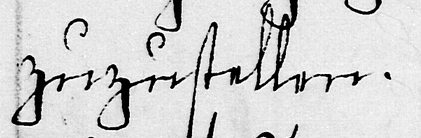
zuzustellen.
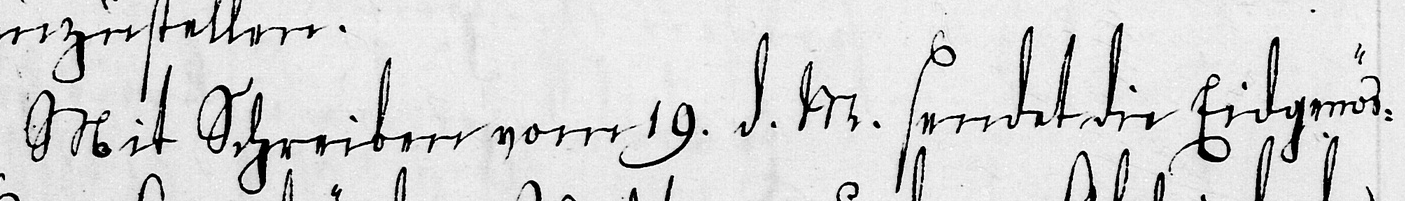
Mit Schreiben vom 19. d. M. sendet die Eidgenö¬
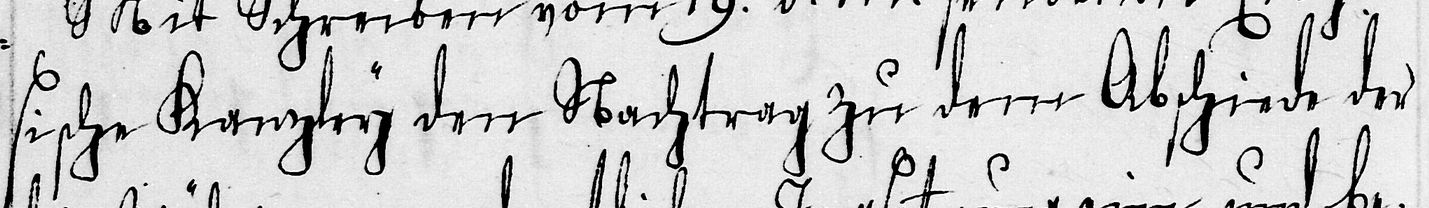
ßische Kanzley den Nachtrag zu dem Abschiede der
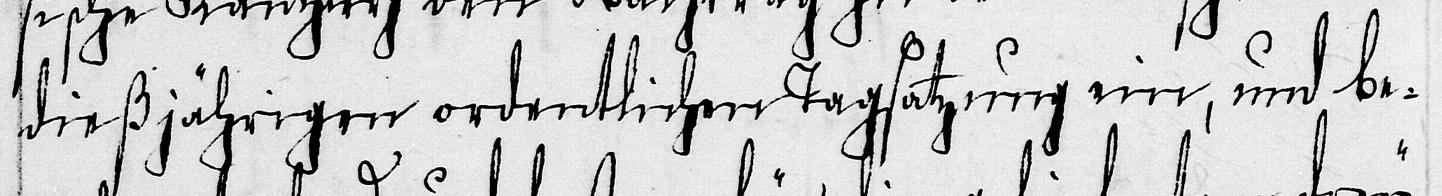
dießjährigen ordentlichen Tagsatzung ein, und be¬
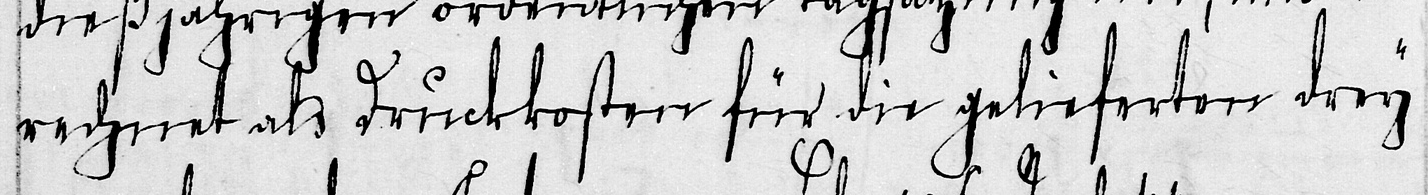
rechnet als Druckkosten für die gelieferten drey
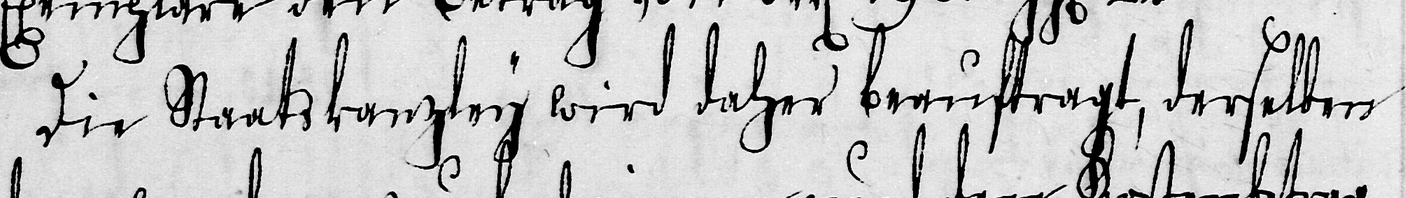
Die Staatskanzley wird daher beauftragt, derselben
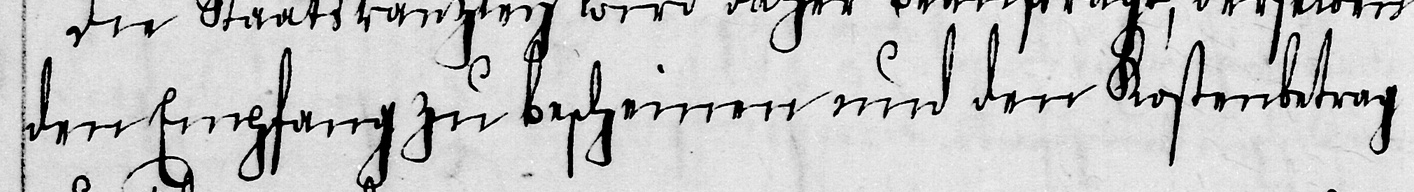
den Empfang zu bescheinen und den Kostenbetrag
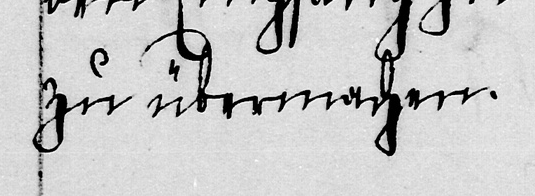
zu übermachen.
